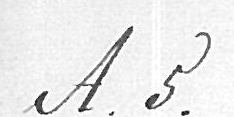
A. 5.
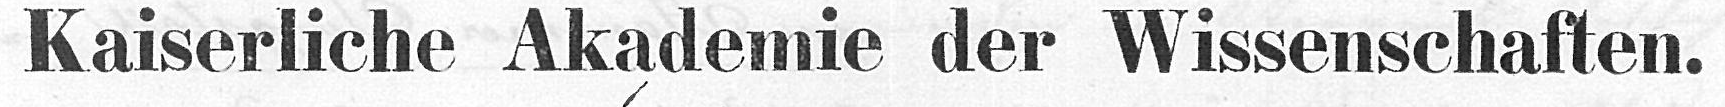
Kaiserliche Akademie der Wissenschaften.
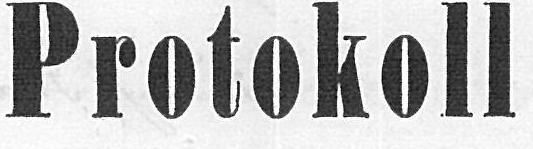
Protokoll
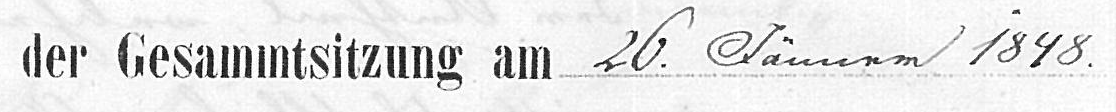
der Gesammtsitzung am 26. Jänner 1848.
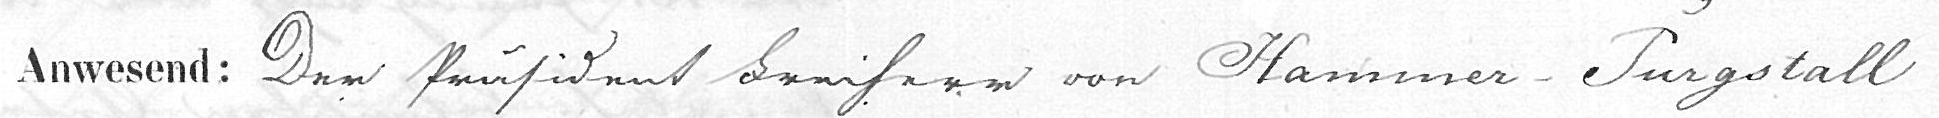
Anwesend: Der Präsident Freiherr von Hammer-Purgstall
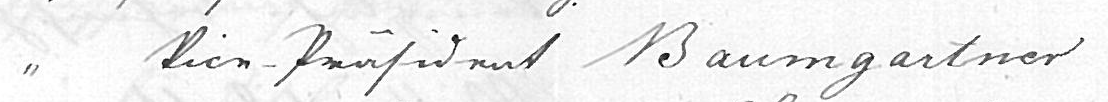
" Vice-Präsident Baumgartner
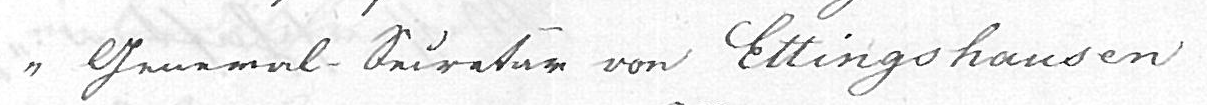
" General-Secretär von Ettingshausen
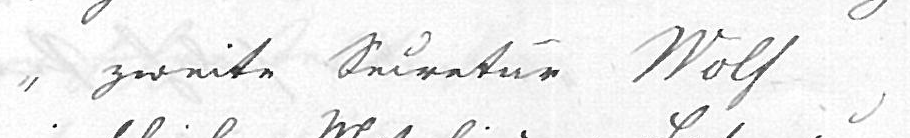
" zweite Secretär Wolf
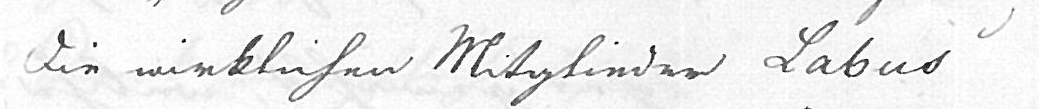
Die wirklichen Mitglieder Labus
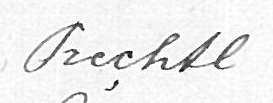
Prechtl
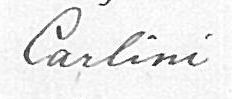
Carlini
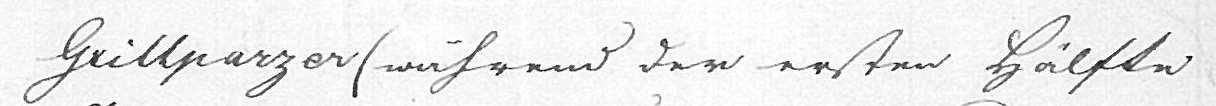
Grillparzer (während der ersten Hälfte
